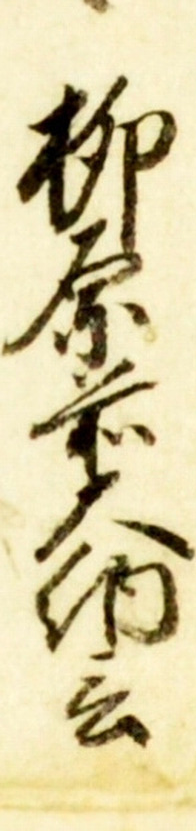柳原前大納言
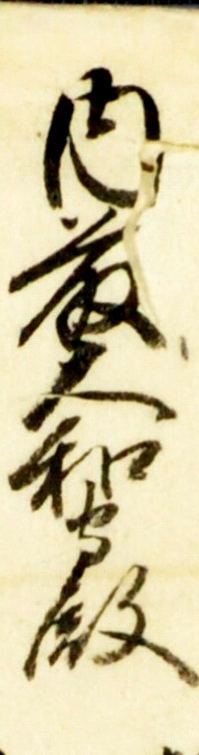内藤大和守殿
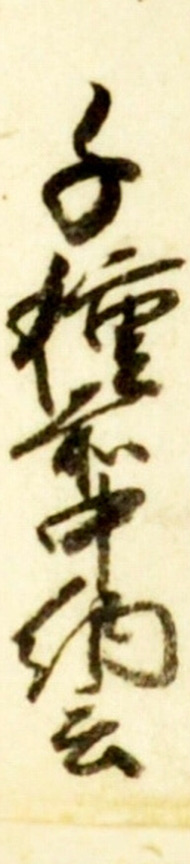千種前中納言

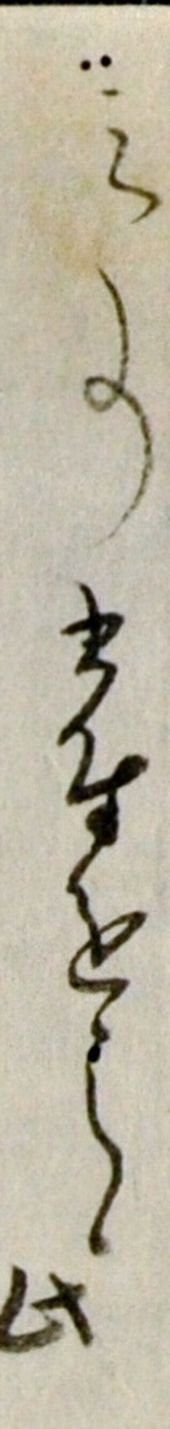之事書付進之候此
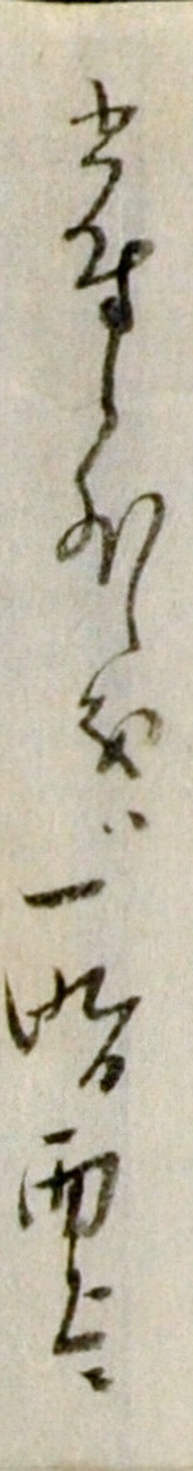書付之外之義は一昨日面上に
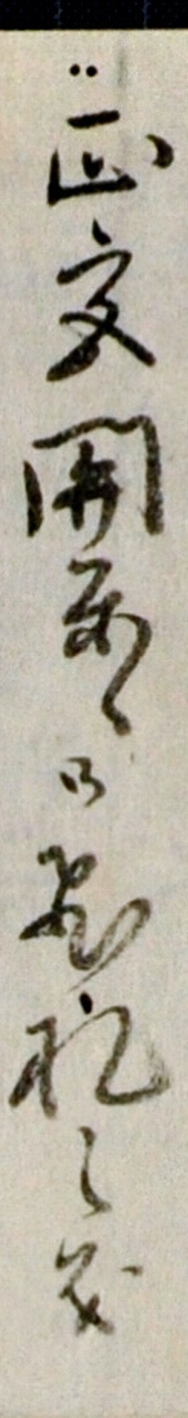正宮関東へ御飛札之義
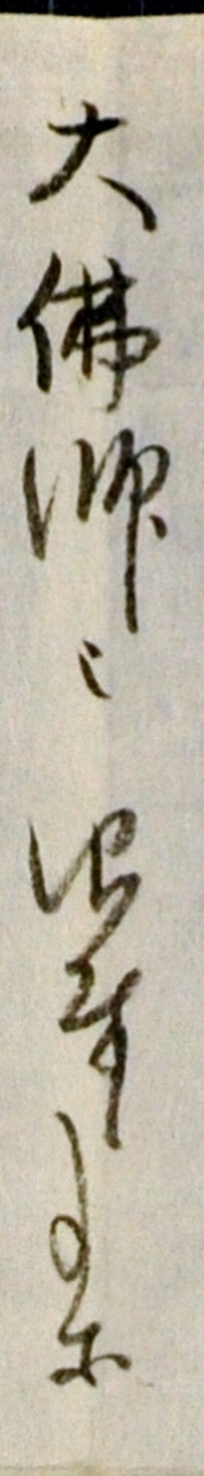大仏師被仰付候事等
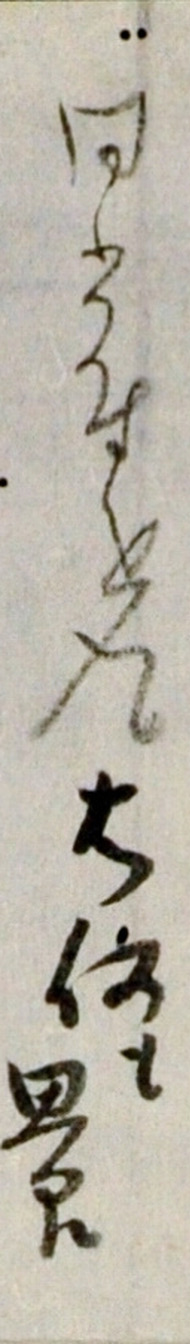同書付進入候右何も思召
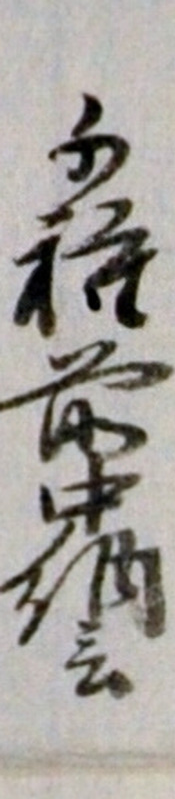千種前中納言
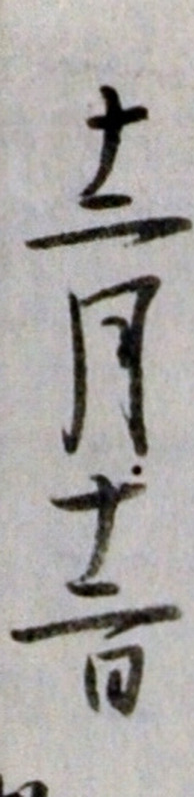十二月十二日
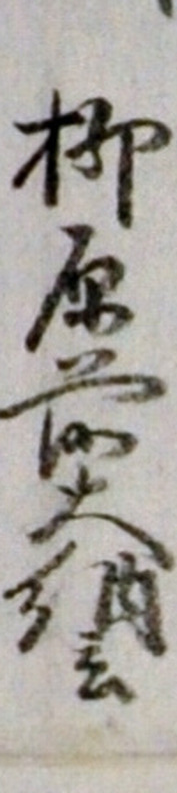柳原前大納言
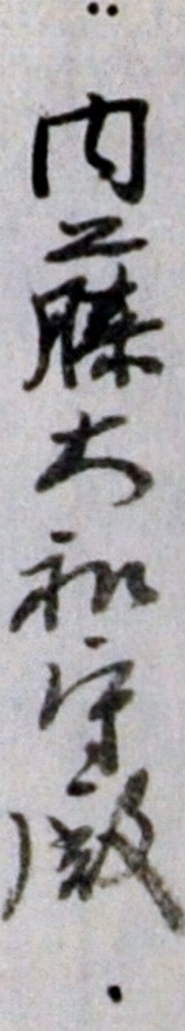内藤大和守殿
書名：書状
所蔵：伊那市立高遠町図書館・合同会社AMANE
